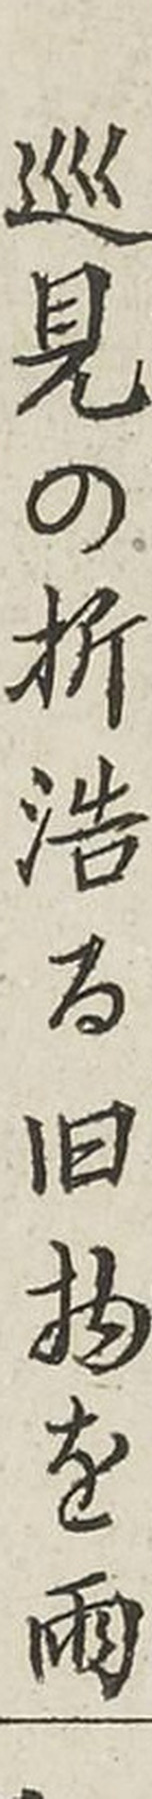巡見の折浩る旧物を雨湯
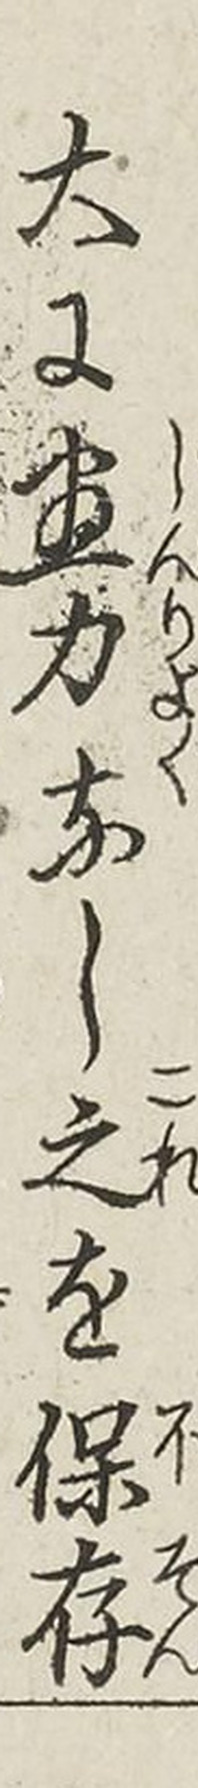大に盡力なし之を保存
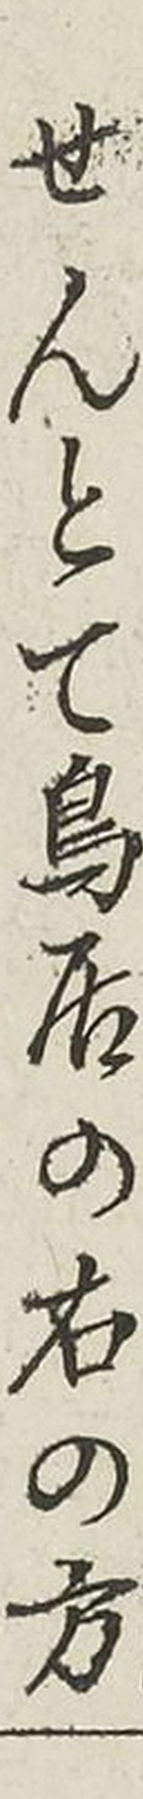せんとて鳥居の右の方
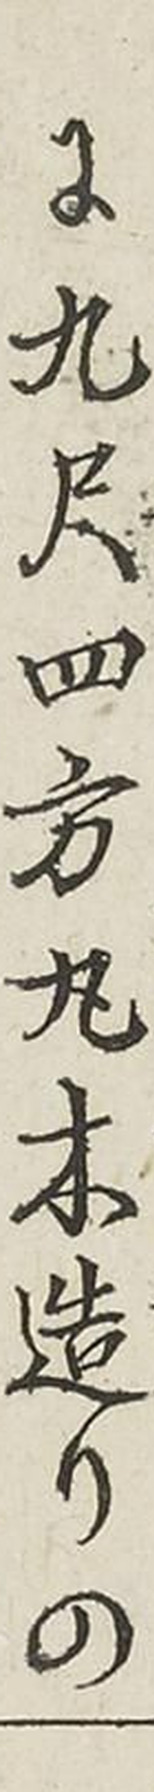に九尺四方丸木造りの
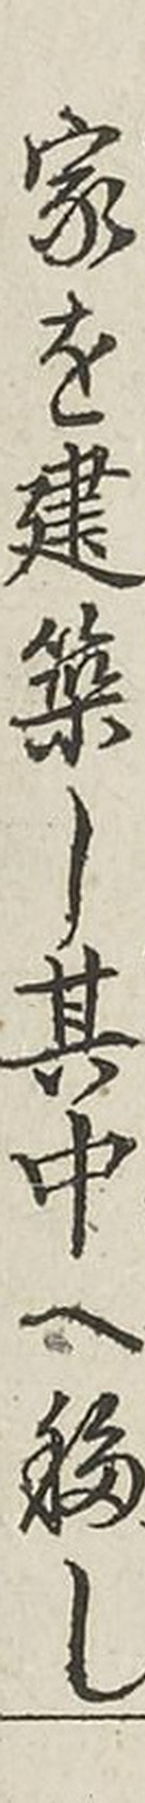家を建築し其中へ移し
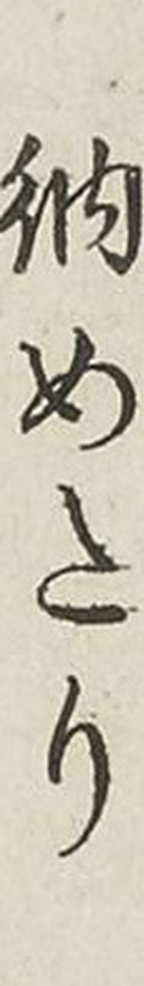納めたり
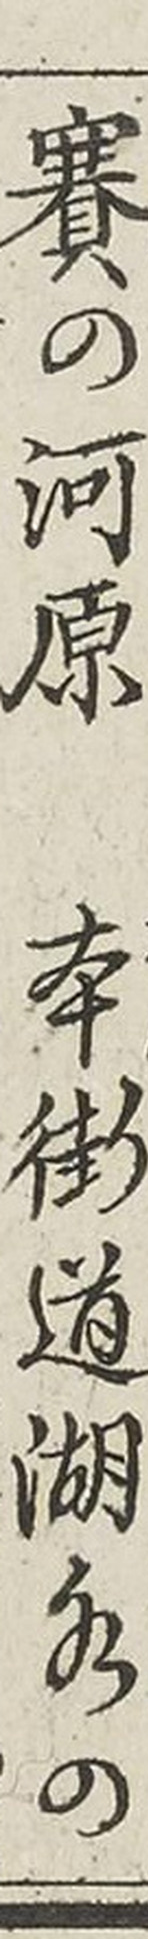賽の河原本街道湖水の
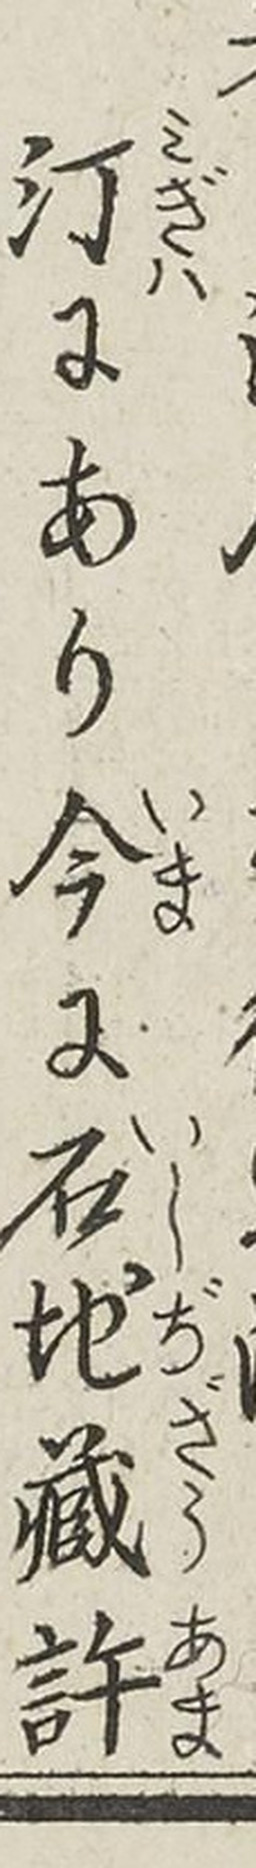汀にあり今に石地蔵許
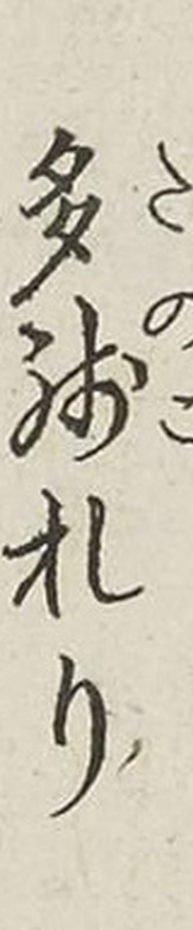多残れり
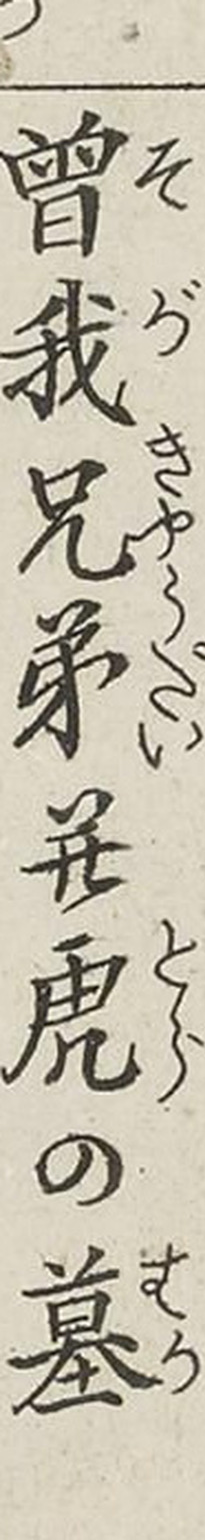曽我兄弟并虎の墓
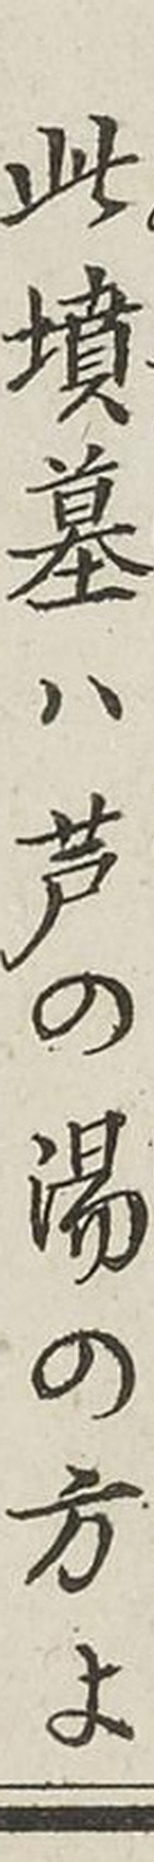此墳墓は芦の湯の方よ
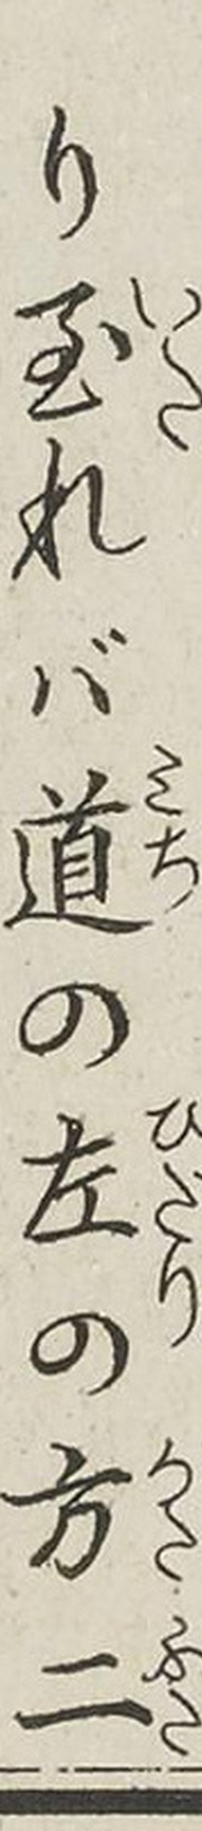り至れば道の左の方二
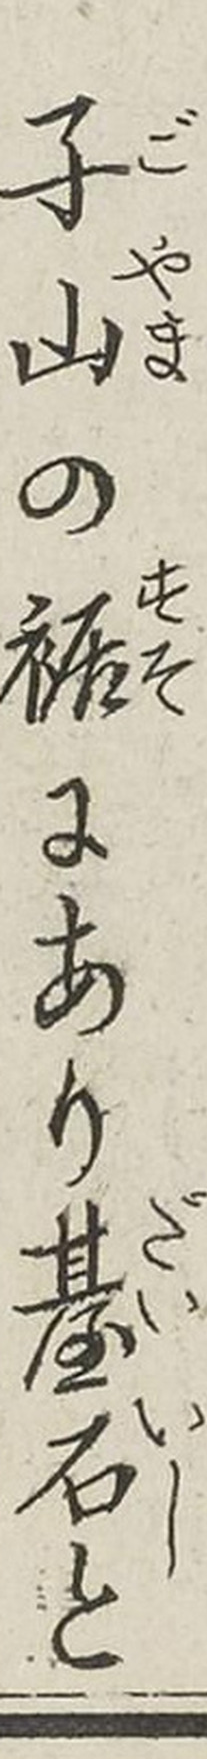子山の裾にあり臺石と
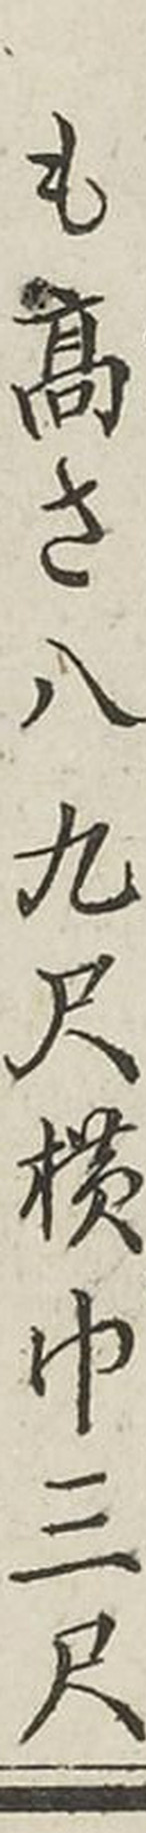も高さ八九尺横巾三尺
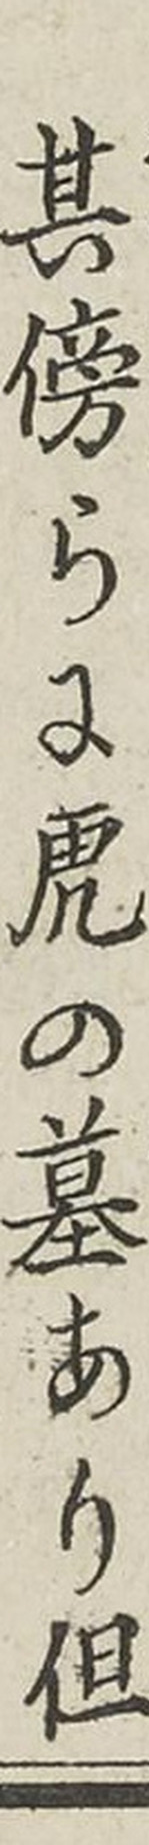其傍らに虎の墓あり但

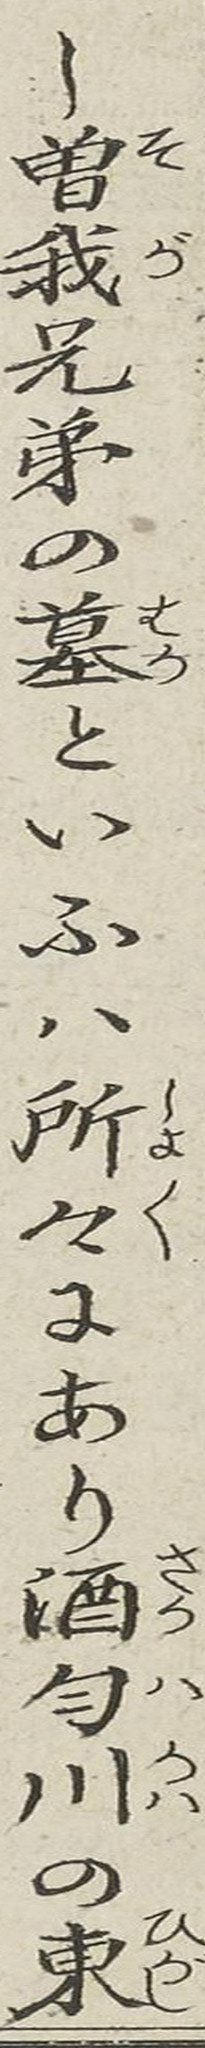し曽我兄弟の墓といふは所々にあり酒匂川の東
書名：箱根温泉誌　全
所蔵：東京大学地震研究所図書室 Earthquake Research Institute Library, The University of Tokyo, JAPAN
